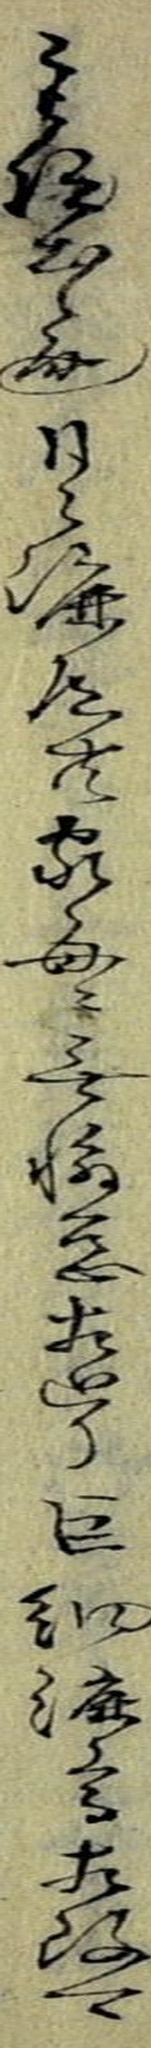ニ被仰出候通月々漉屋共家毎ニ無懈怠相廻り巨細漉高相改可
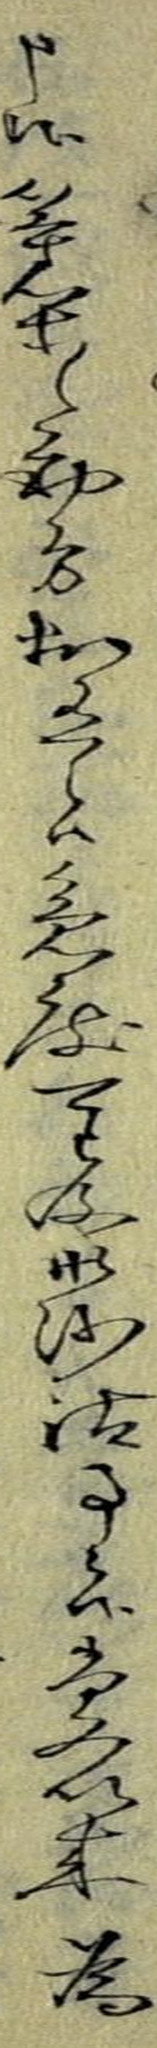申候等閑之勤方於有之ハ急度可被及御沙汰事ニ候尚又以来為
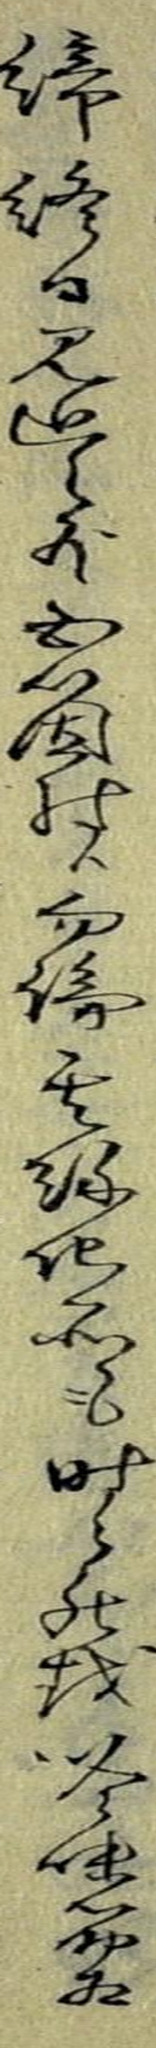締終日見廻之外五箇村ハ勿論其余他所へ時々罷越吟味筋相
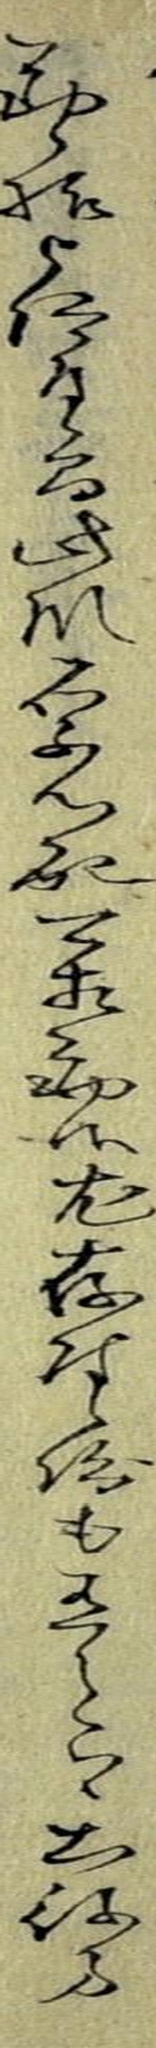勤候様被仰付候間此段厚心配可相勤候尤存付之儀も有之候ハヽ出役方
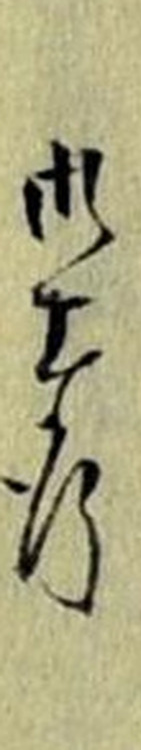御奉行
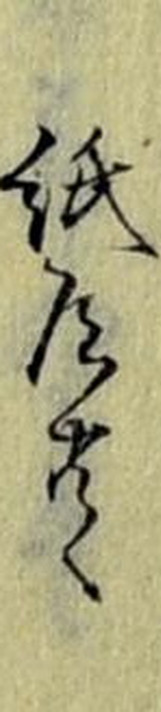紙屋共へ
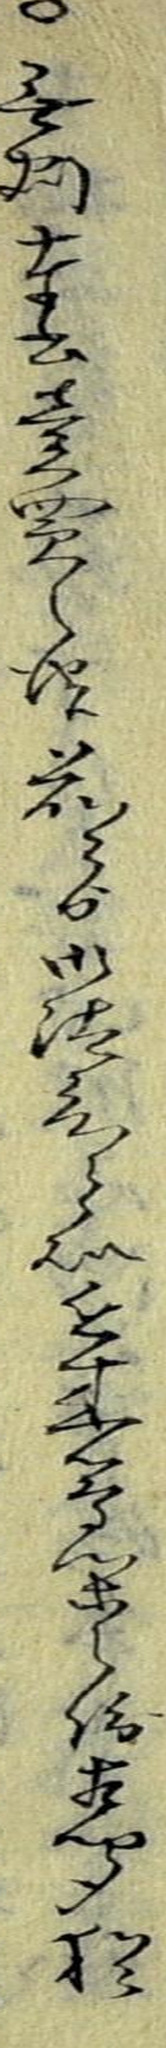○無判奉書売買之儀ハ前々ゟ御法度ニ候処近来等閑之儀相聞猶
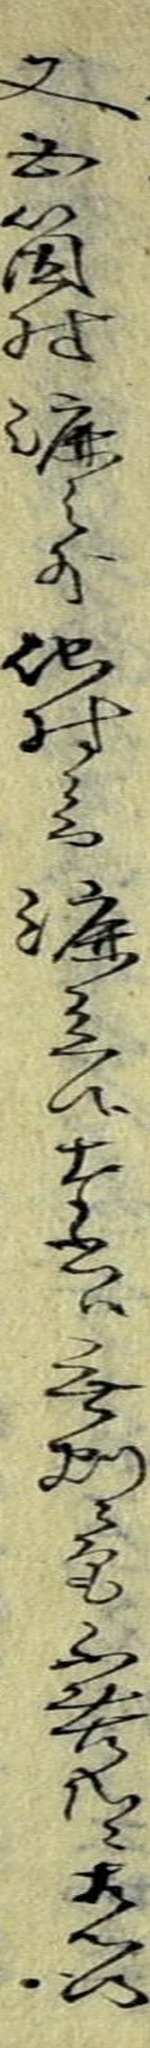又五箇村漉之外他村ニ而漉立候奉書ハ無判ニ而不苦哉ニ相心得
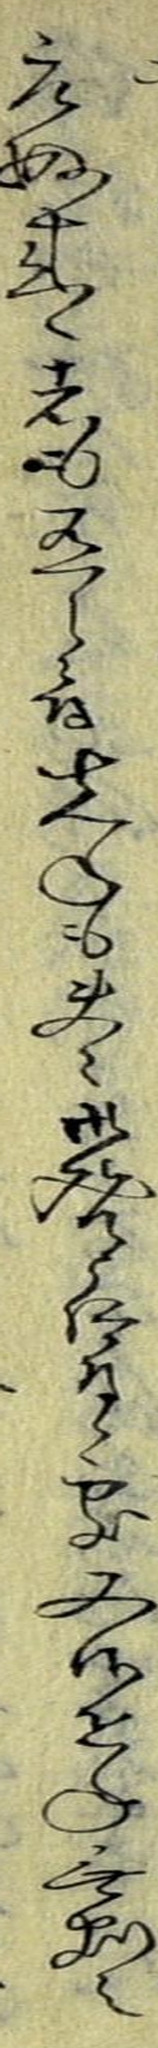取扱来候者も有之ニ付先年も夫々御咎被仰付候処又候近年無判之
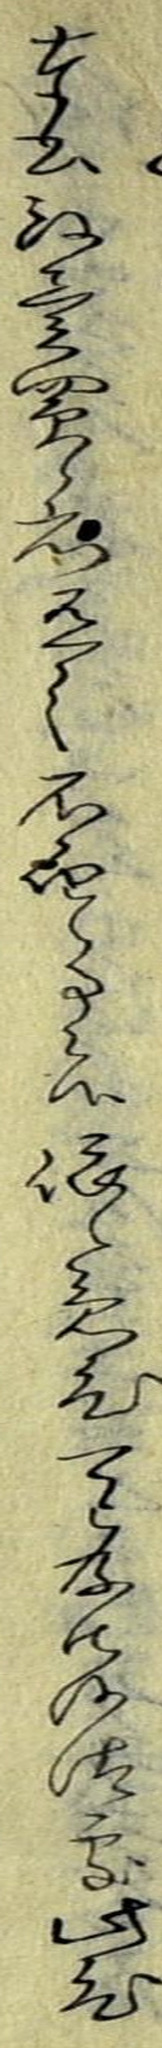奉書致売買候者有之不届之事ニ候依之急度可被及御沙汰処此度

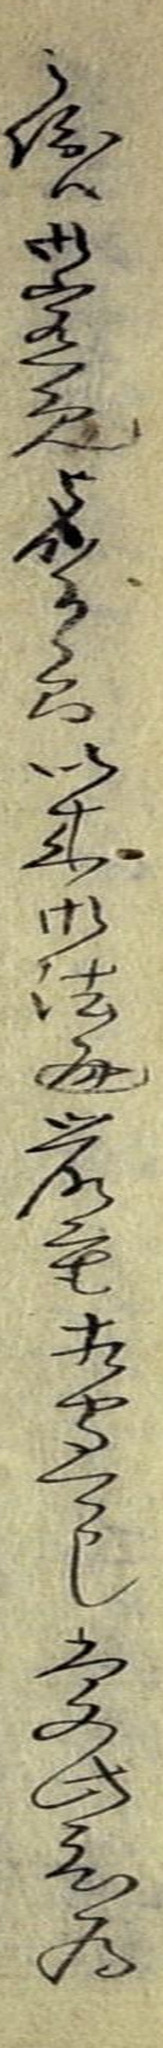之儀ハ御宥免被成下候間以来御法通厳重相守可申候尚又此度為
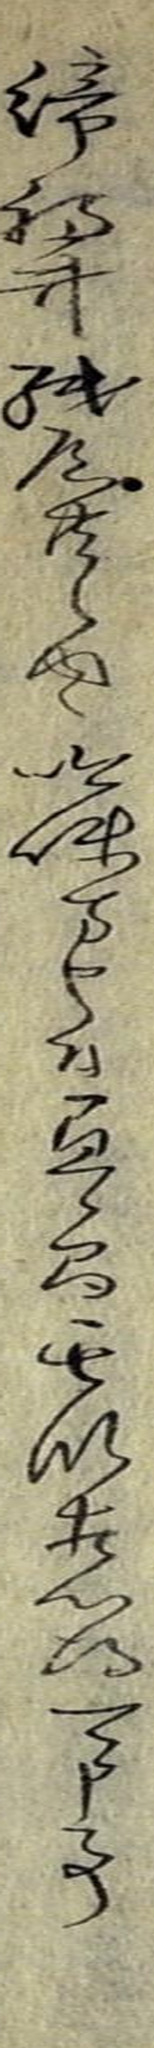締福井紙屋共之内へ吟味方申付置候間其段相心得可申事
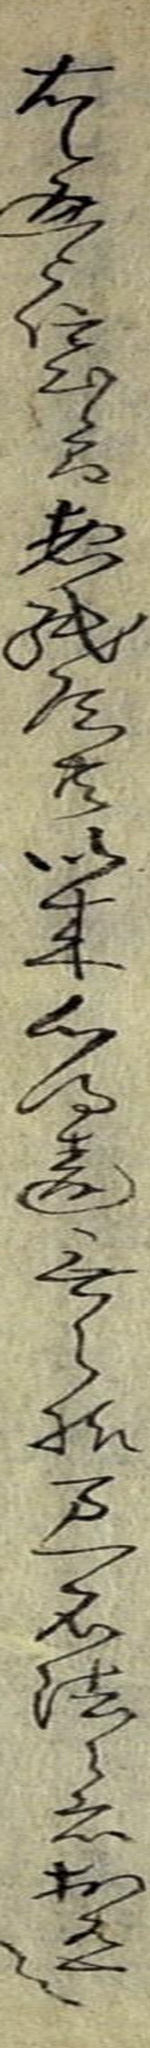右之通被仰出候間惣紙屋共以来心得違無之様万一不法之者於有之
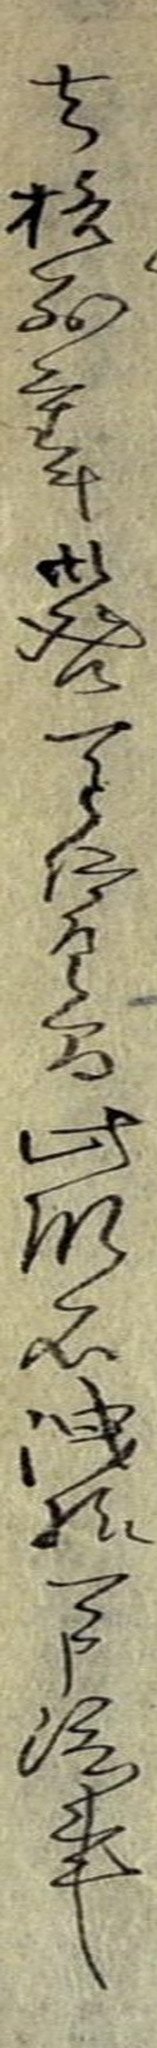者格別重キ御咎可被仰付候間此段不洩様可申渡事
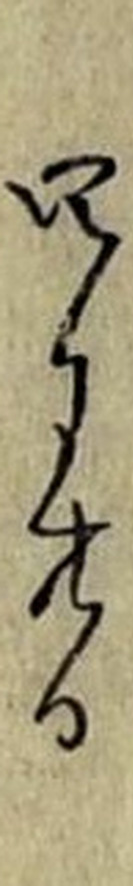四月廿日
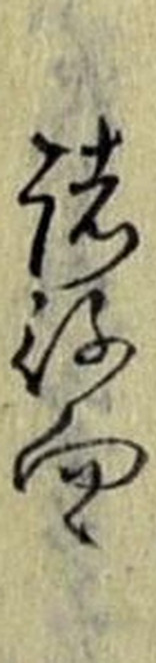諸役向へ
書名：命令之部 五
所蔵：福井県文書館 Fukui Prefectural Archives
